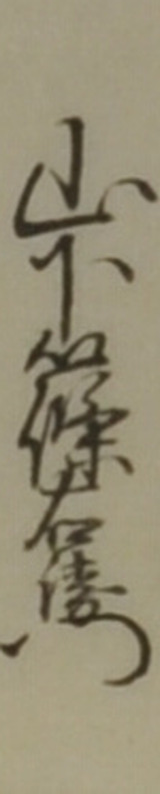山下篠右衛門
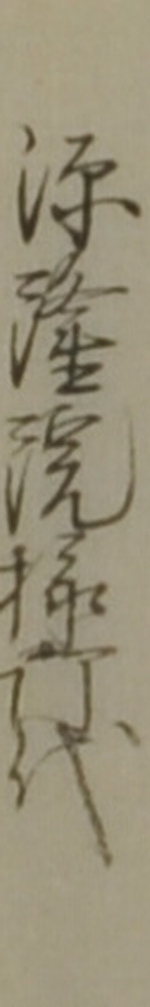源隆院様御代
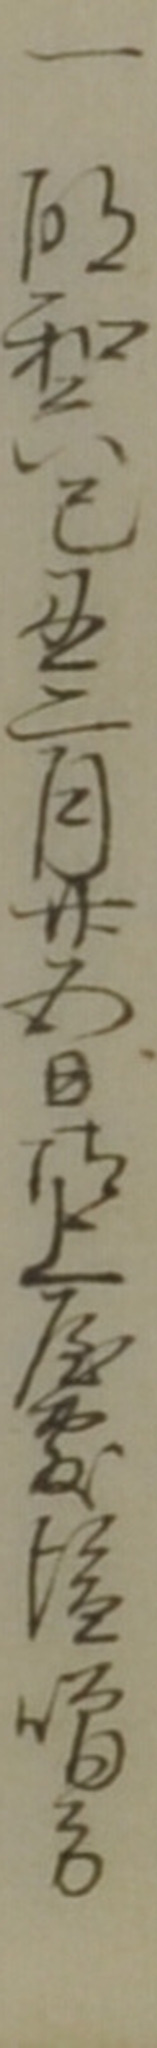一明和六己丑二月廿五日御上屋敷塩噌方
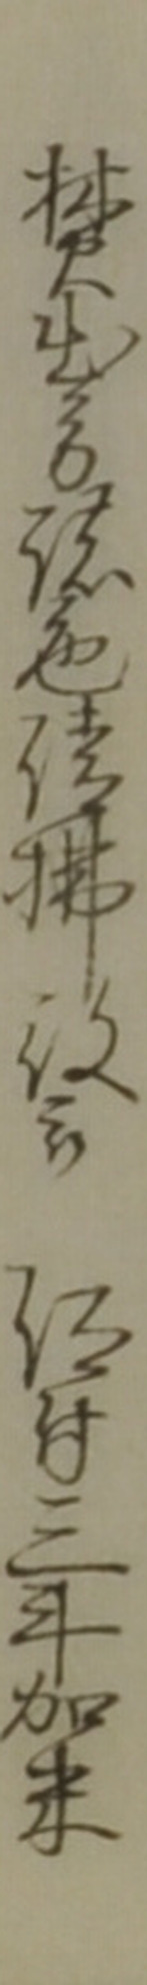焚出方諸色請払役被仰付三斗加米
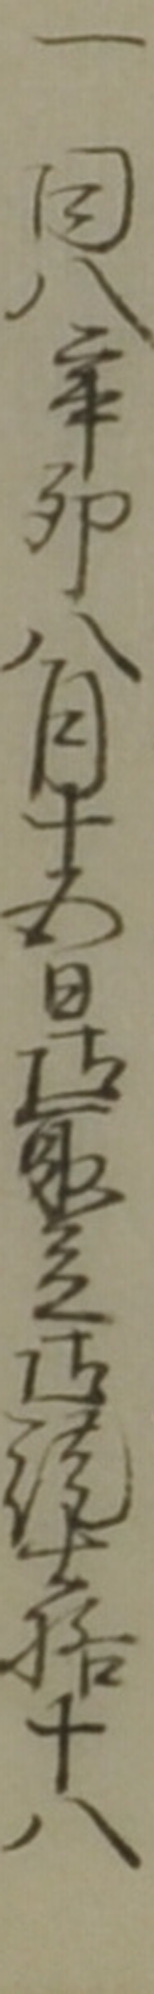一同八辛卯八月十五日御取立御徒士格十八
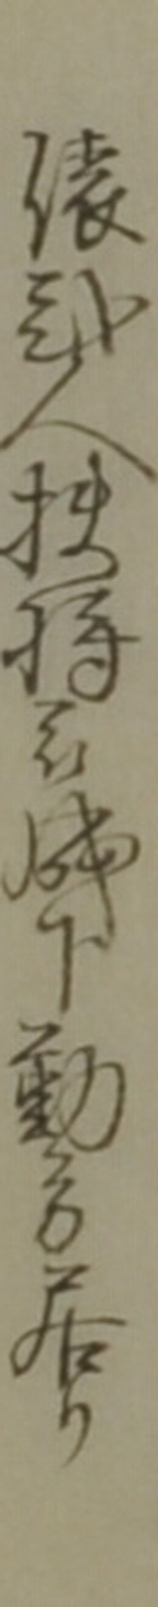俵弐人扶持被成下勤方居り
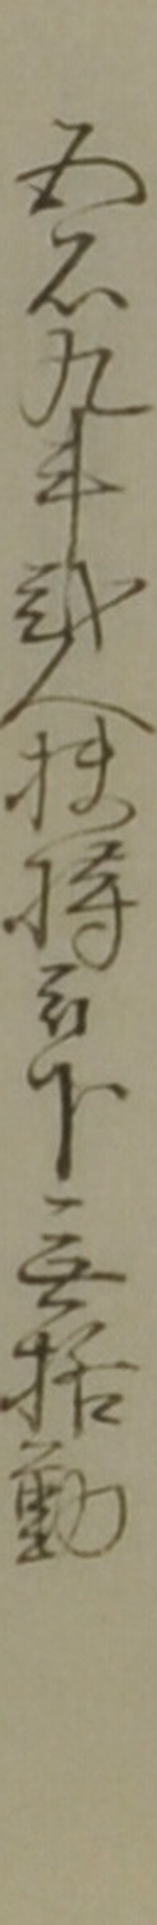五石九斗弐人扶持被下無格勤
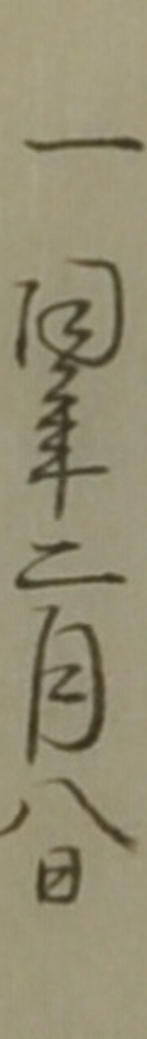一同年二月八日
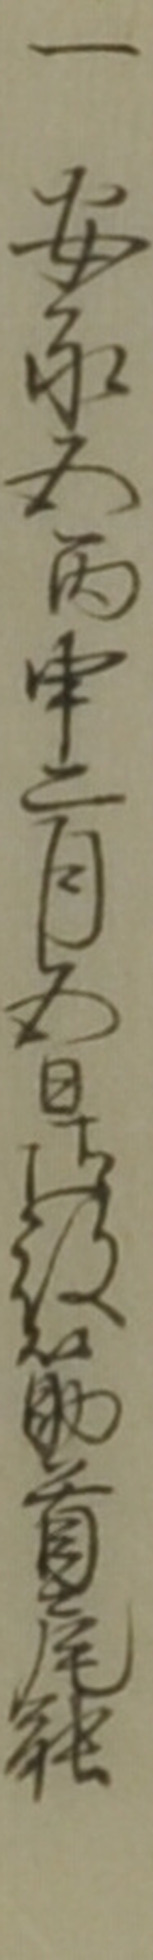一安永五丙申二月五日御役筋首尾能
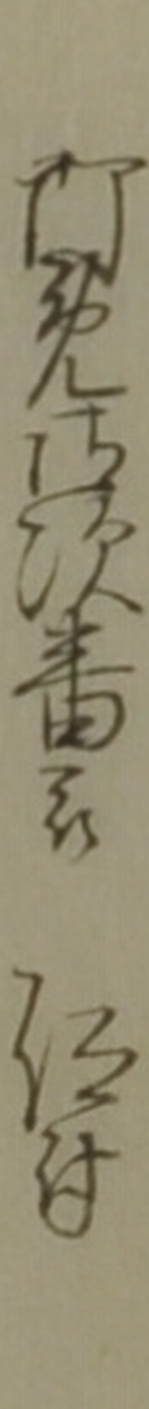御免御次番被仰付
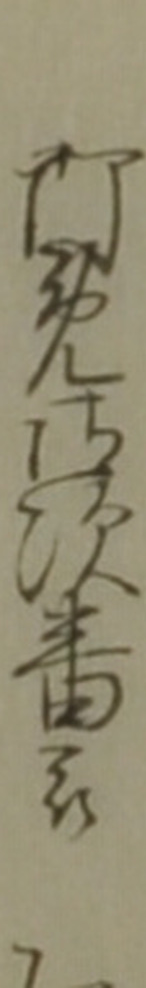御免御次番被仰付
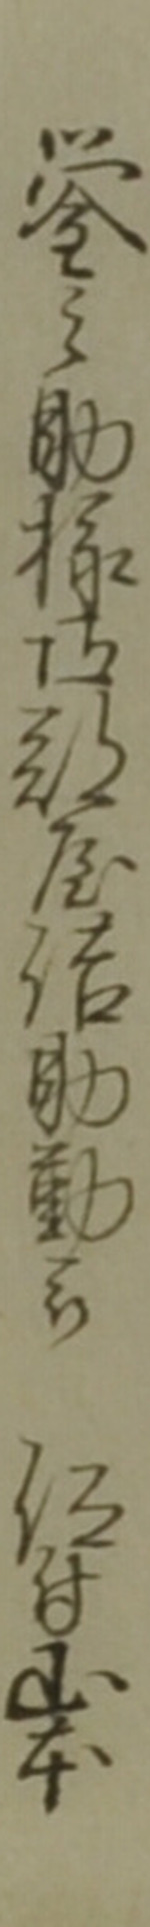之助様御郡屋詰助勤被仰付山本
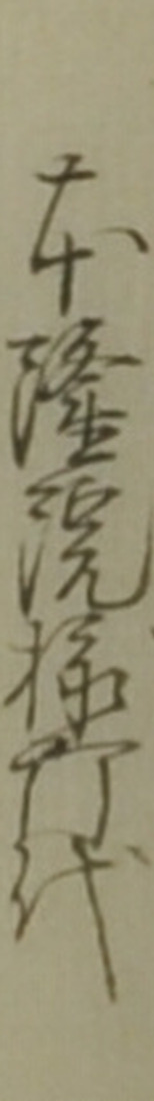本隆院様御代
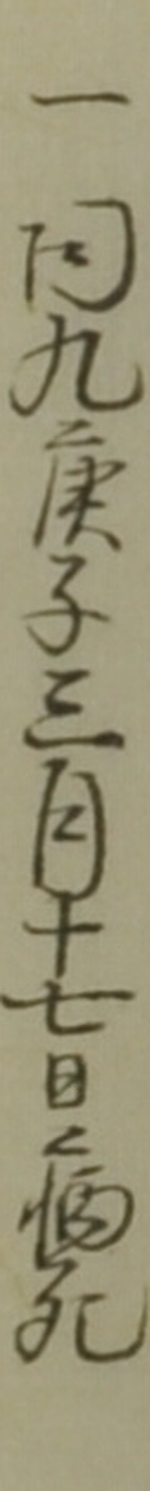一同九庚子三月十七日病死
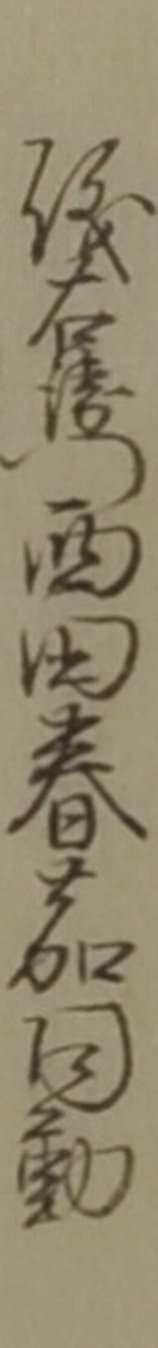儀右衛門西田春嘉同勤

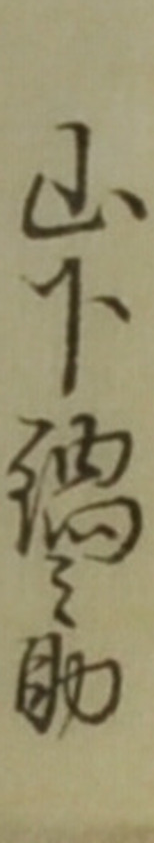山下鍋之助
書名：無足廃家（弐）
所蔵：伊那市立高遠町図書館・合同会社AMANE
